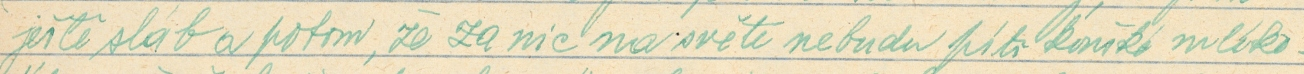ještě sláb a potom, že za nic na světě nebudu píti koňské mléko.
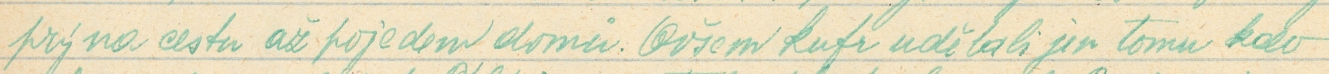prý na cestu až pojedem domů. Ovšem kufr udělali jen tomu kdo
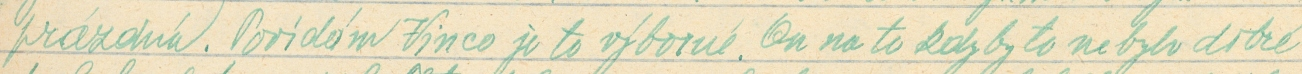prázdná. Povídám Vinco je to výborné. On na to kdyby to nebylo dobré
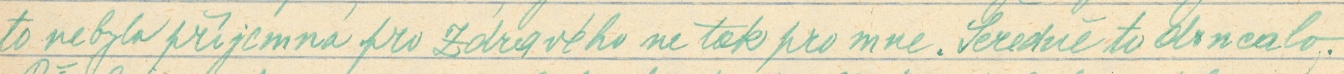to nebyla příjemná pro zdravého ne tak pro mne. Šeredně to drncalo.
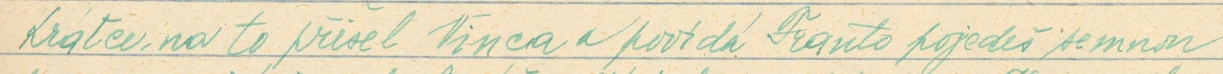Krátce na to přišel Vinca a povídá Franto pojedeš se mnou
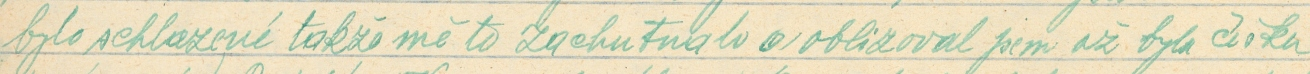bylo schlazené takže mě to zachutnalo a oblizoval jsem až byla číška
